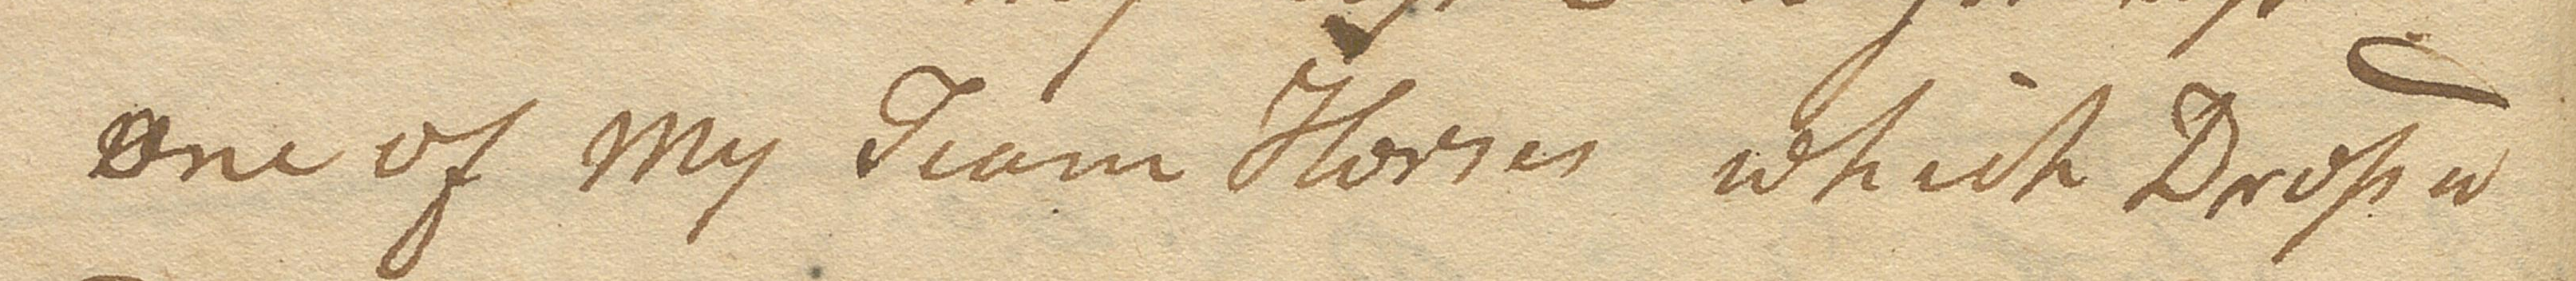one of My Team Horses which Droped
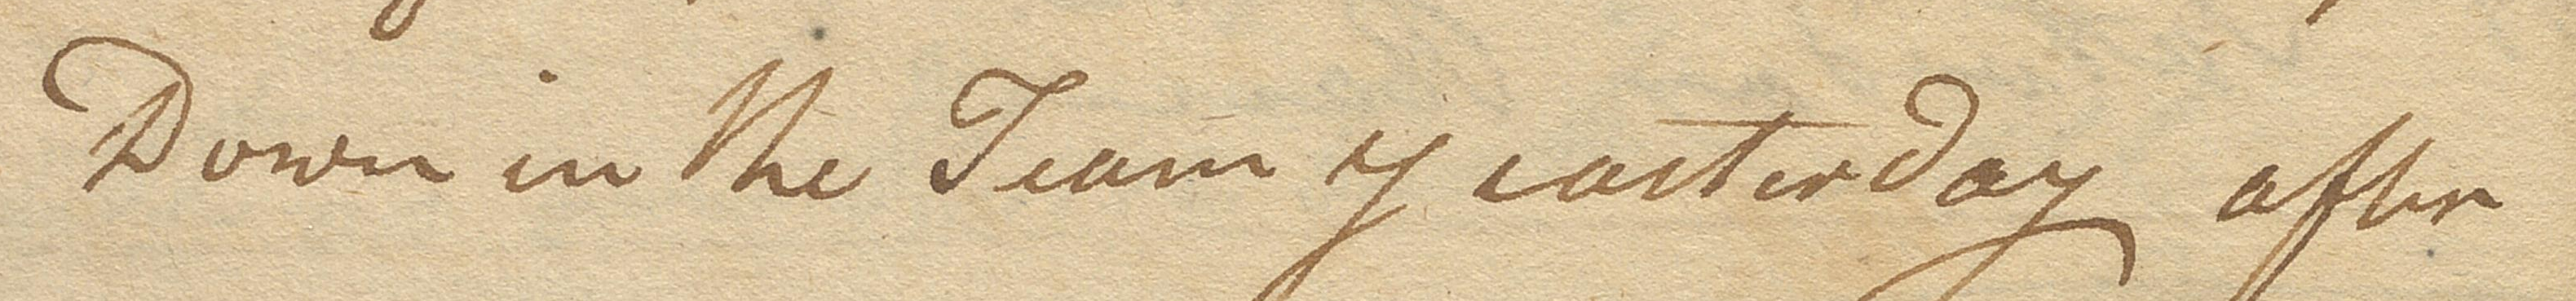Down in the Team yeasterday after
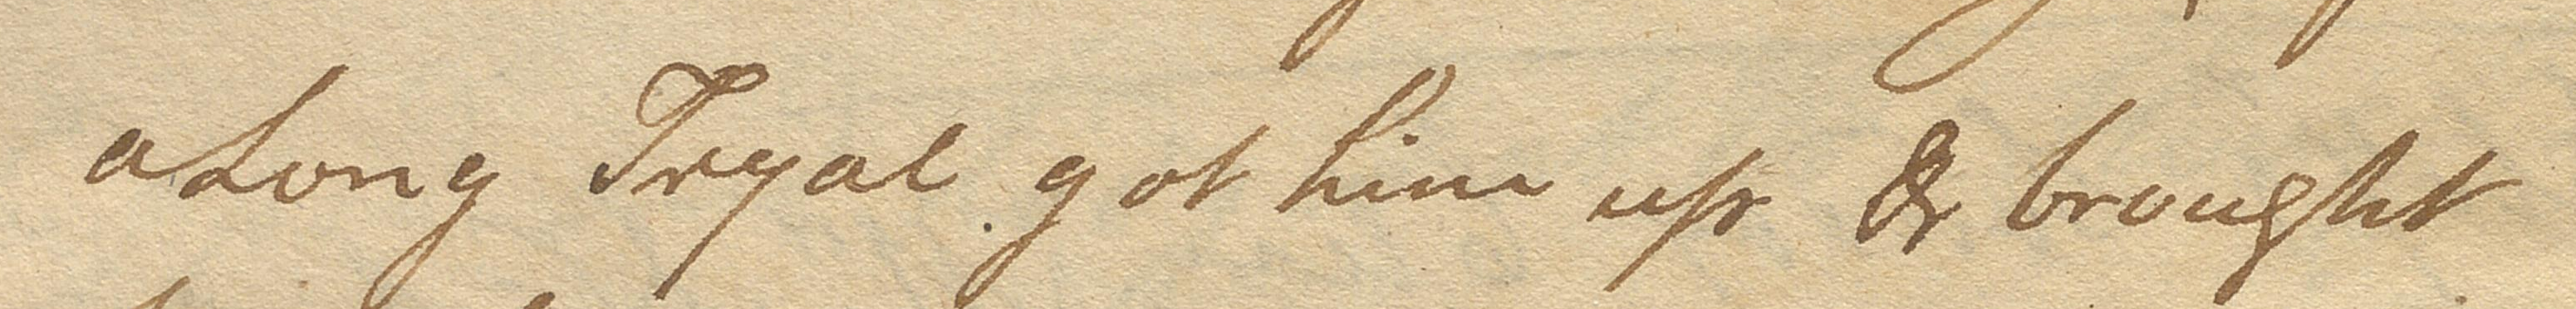a Long Tryal got him up & brought
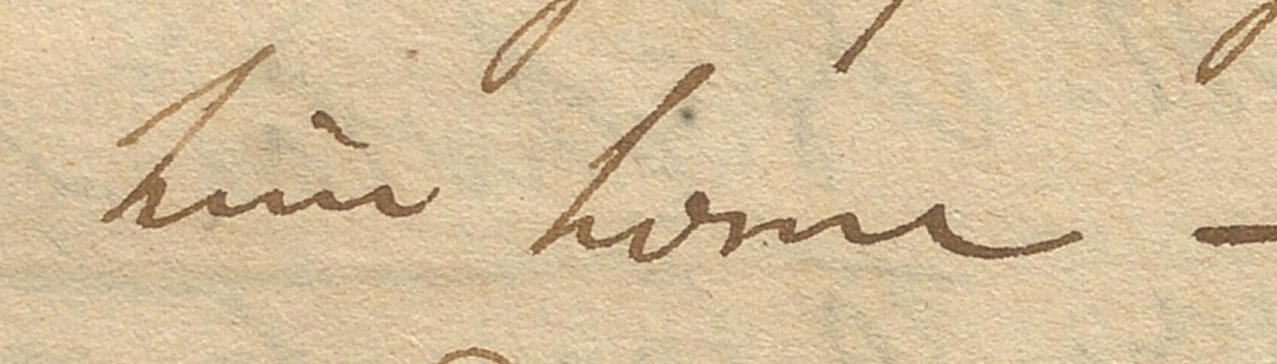him home.
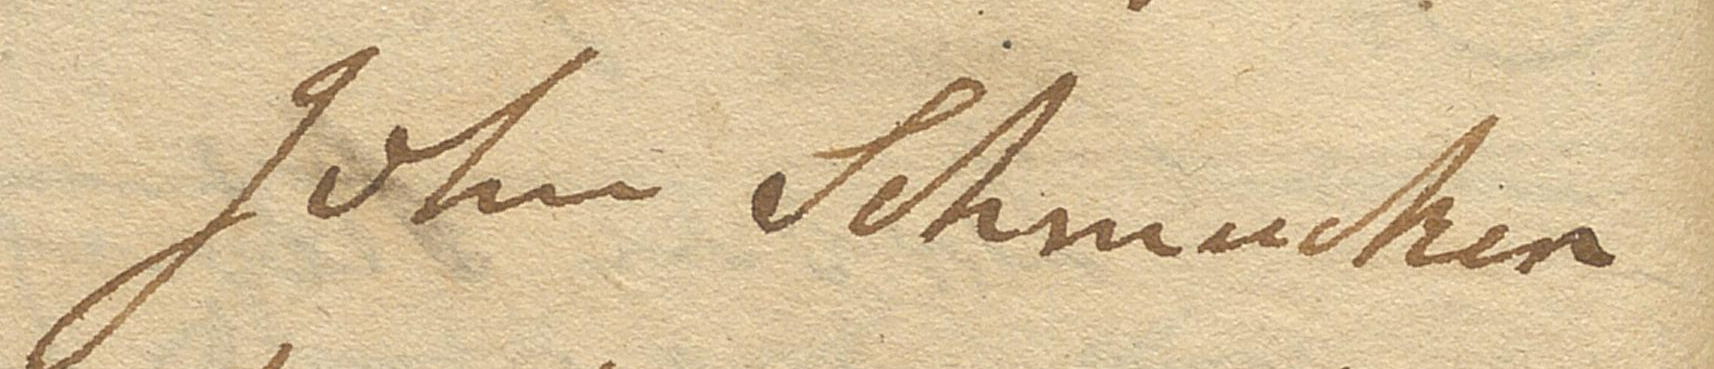John Schmucker
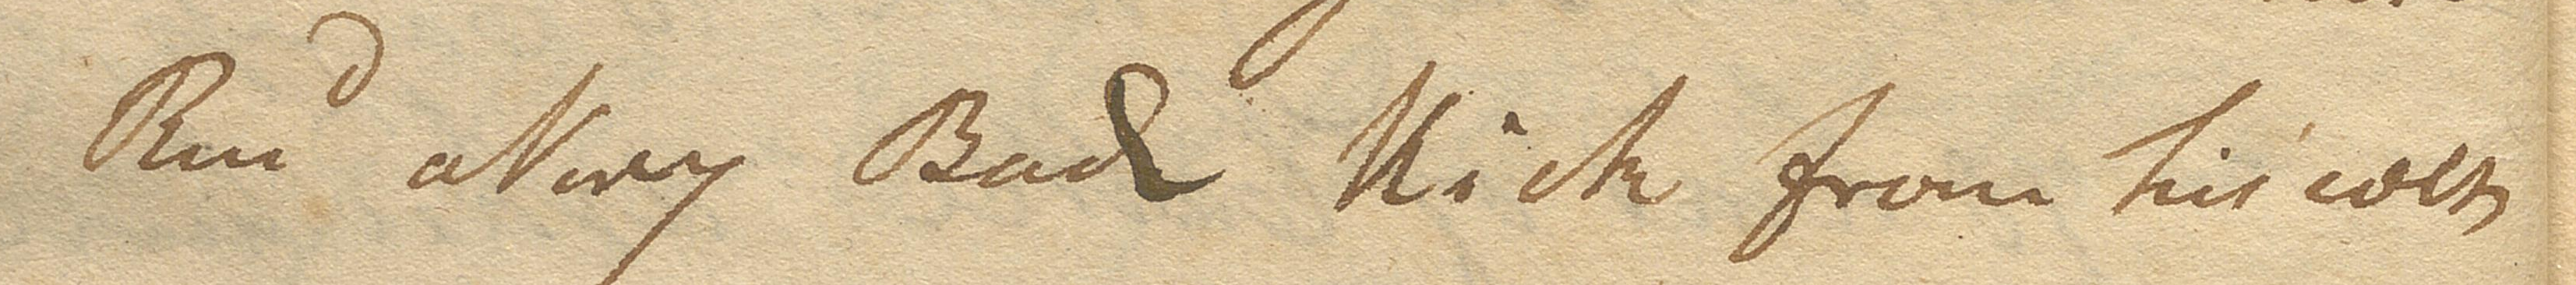Rec^d a Very Bad Kick from his colt
